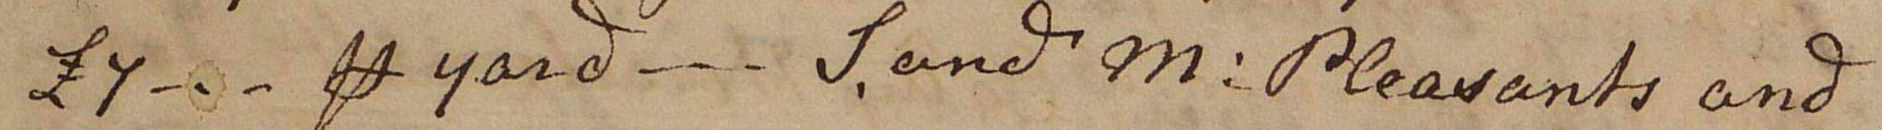£7-- per yard- S and M: Pleasants and
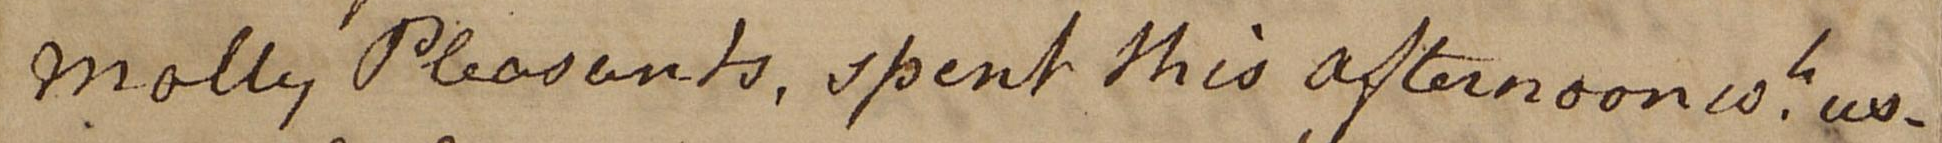Molly Pleasants, spent this afternoon w^h. us-
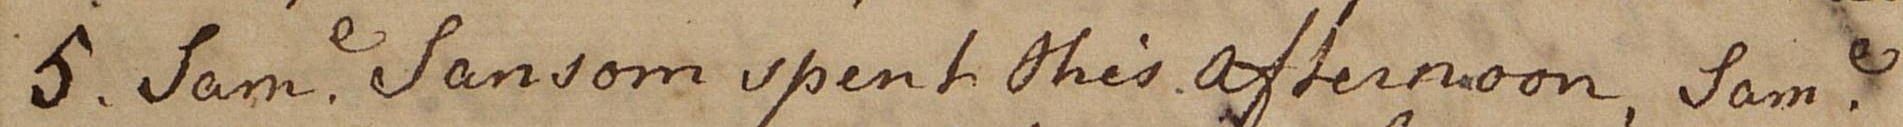5. Sam^l. Sansom spent this afternoon, Sam^l.
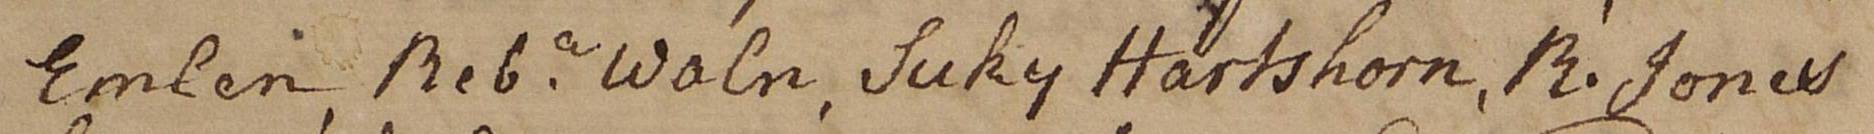Emlen, Reb^a. Waln, Suky Hartshorn, R. Jones
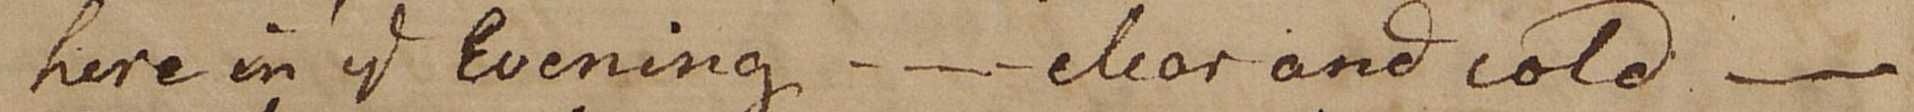here in y^e Evening-- clear and cold-
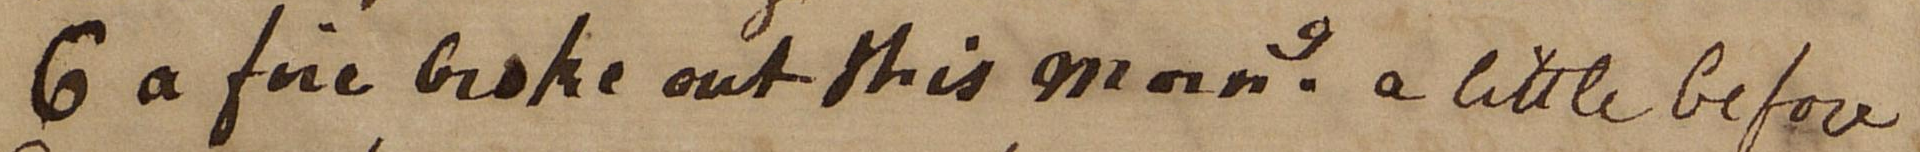6 a fire broke out this morn^g. a little before
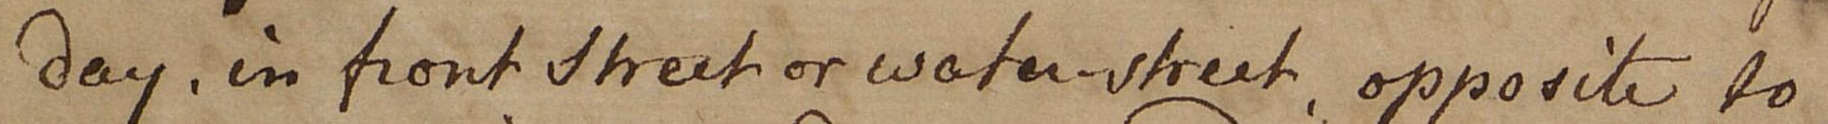day, in front Street or water-street, opposite to
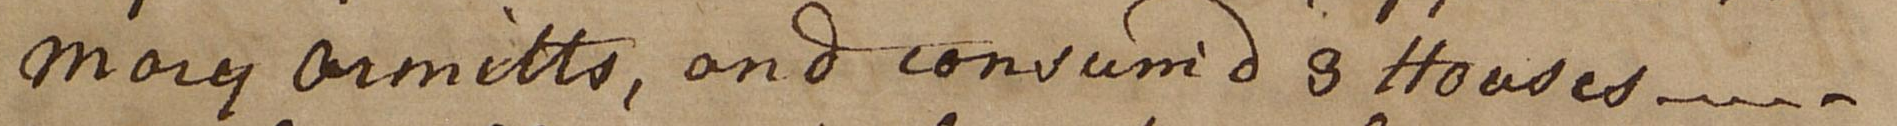Mary Armitts, and consum'd 3 Houses--
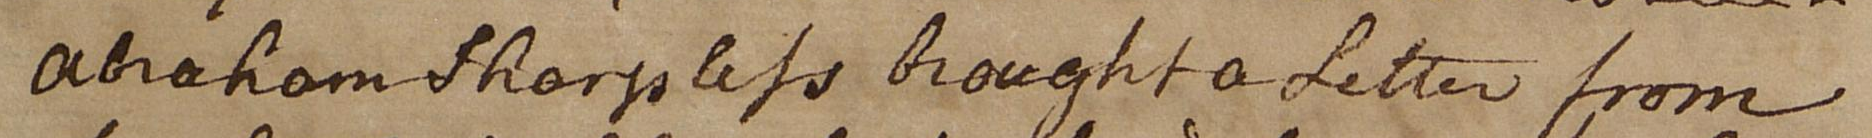Abraham Sharpless brought a Letter from
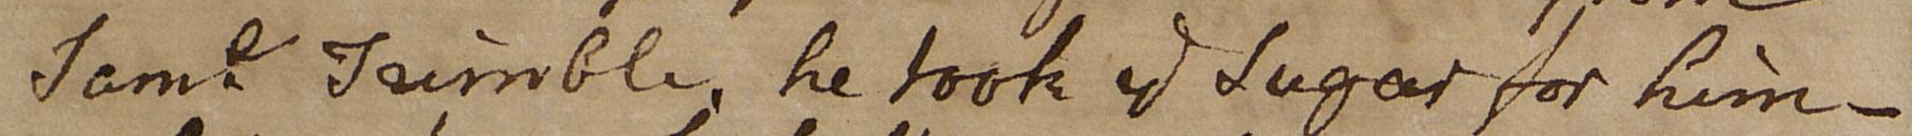Sam^l. Trimble, he took y^e Sugar for him-
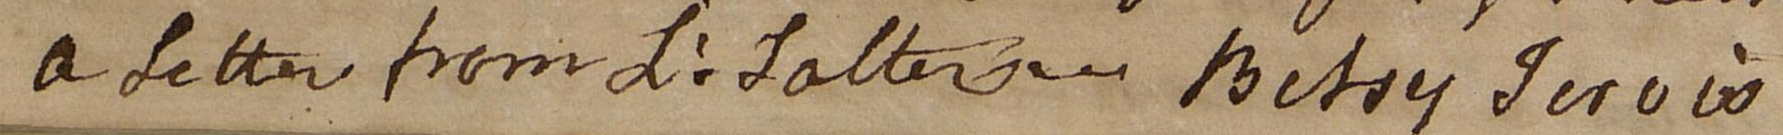a Letter from L. Salters- Betsy Jervis
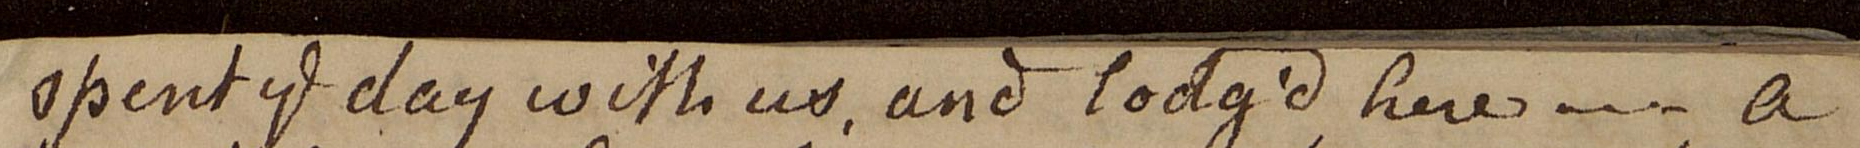spent y^e day with us and lodg'd here- A
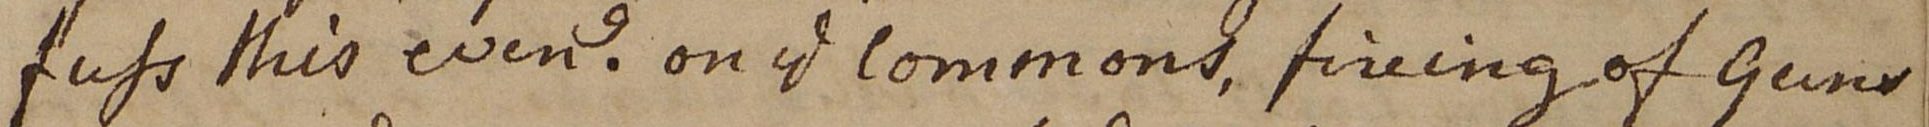fuss this even^g. on y^e commons, fireing of Guns
